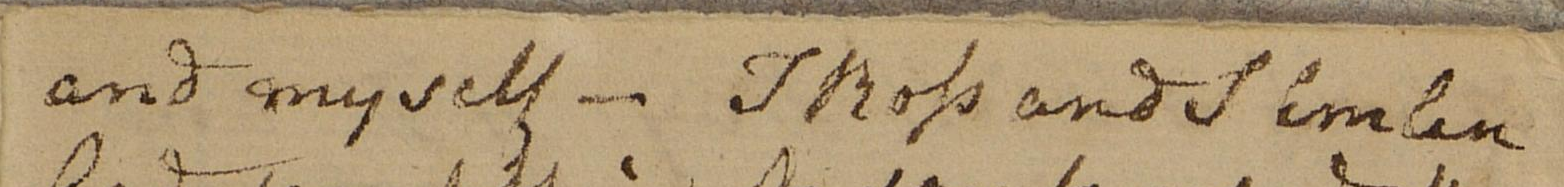and myself- T Ross and S Emlen
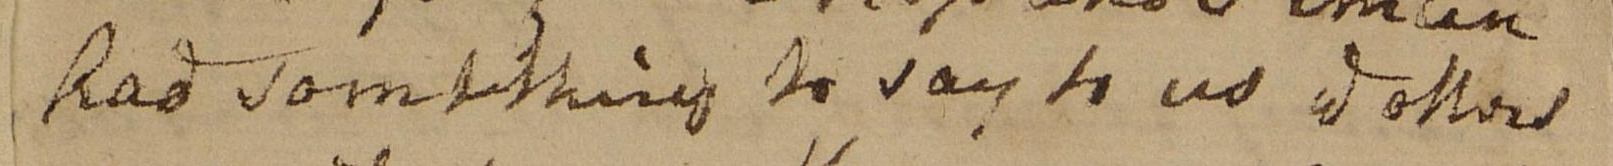had something to say to us y^e others
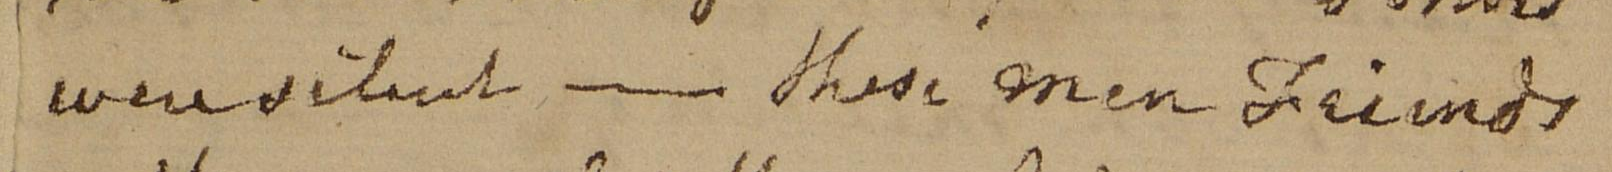were silent- these men Friends
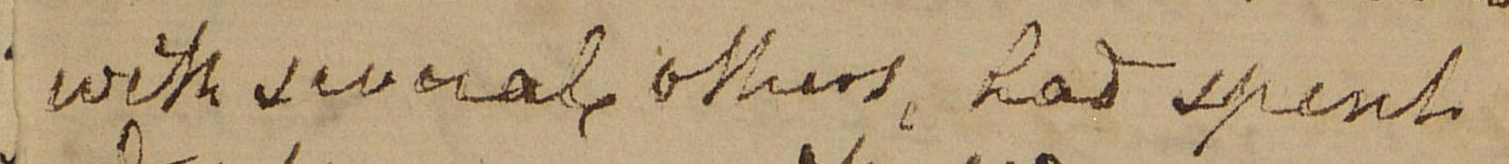with several others, had spent
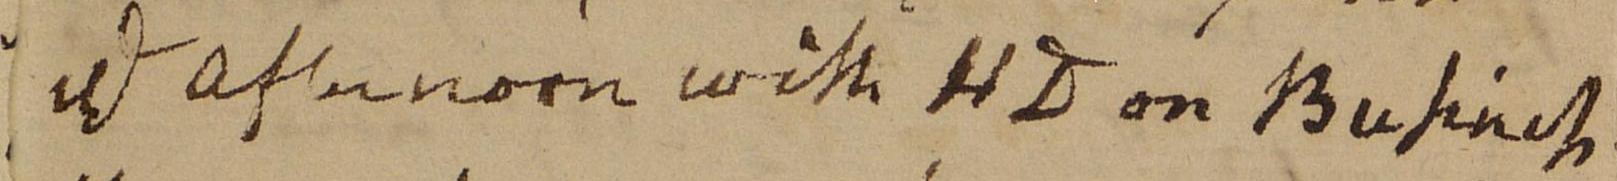y^e Afternoon with HD on Business
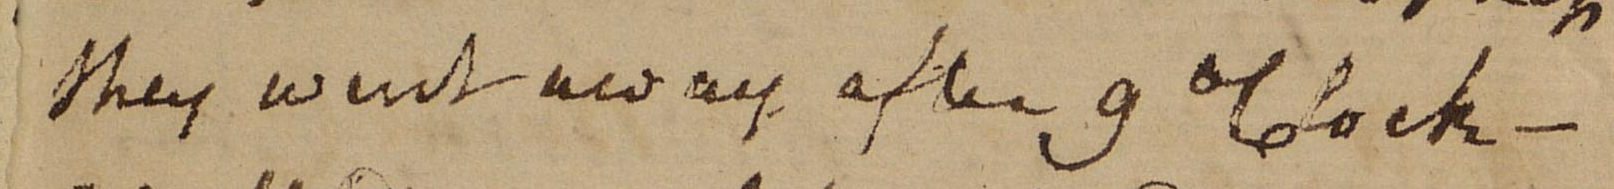they went away after 9 ^oClock-
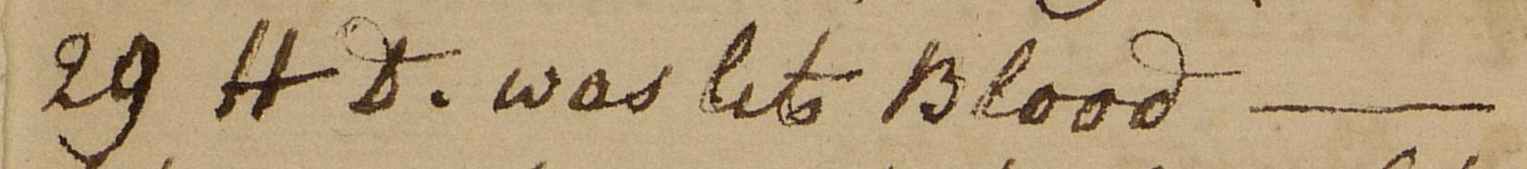29 HD was let Blood-
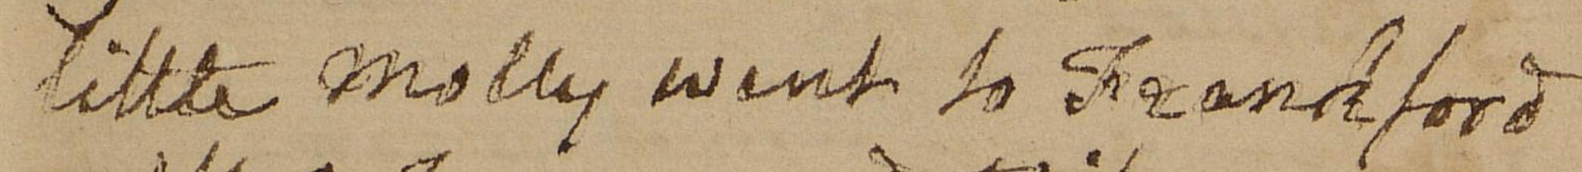little Molly went to Frankford
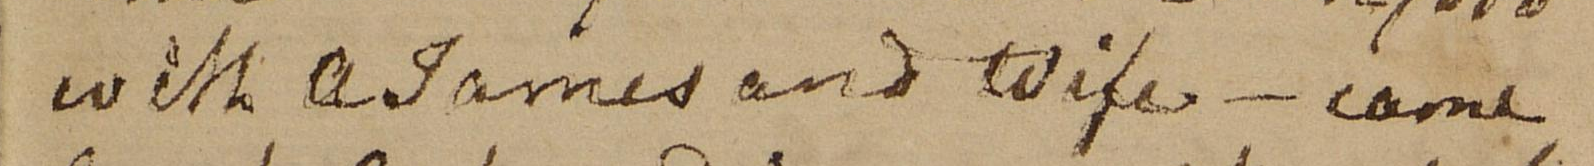with A James and Wife- came
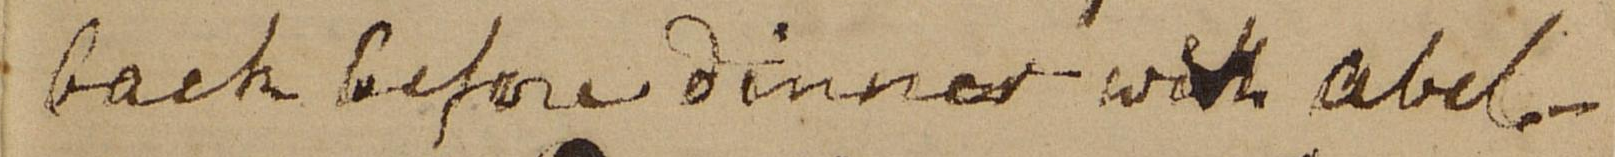back before dinner with Abel-
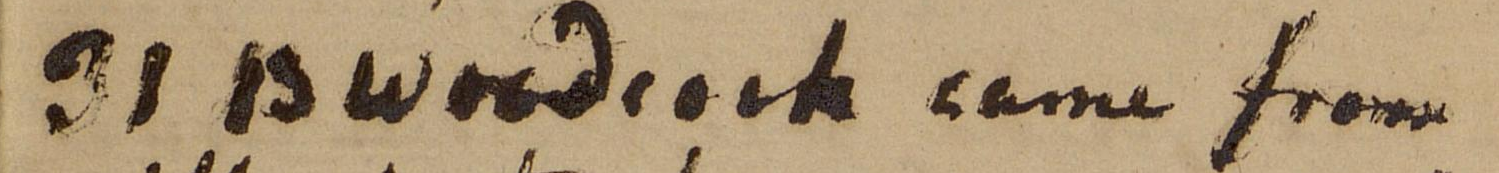31 B Woodcock came from
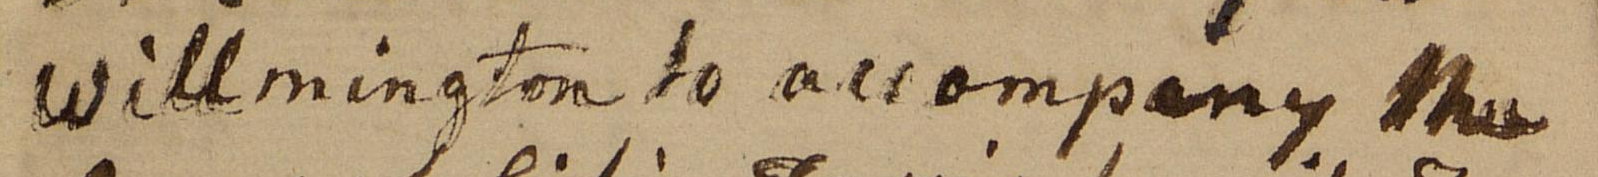Willmington to accompany thee
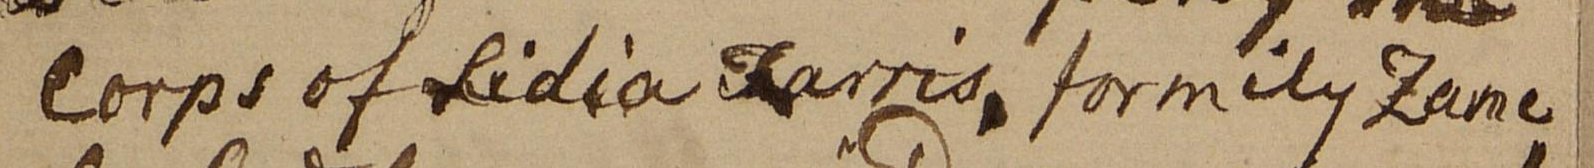Corps of Lidia Farris, formily Zane
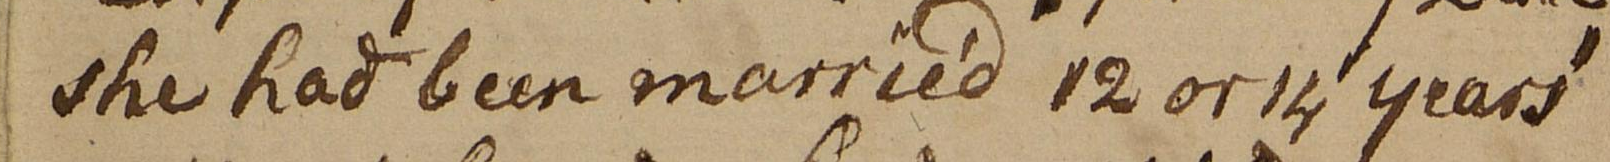she had been married 12 or 14 years'
